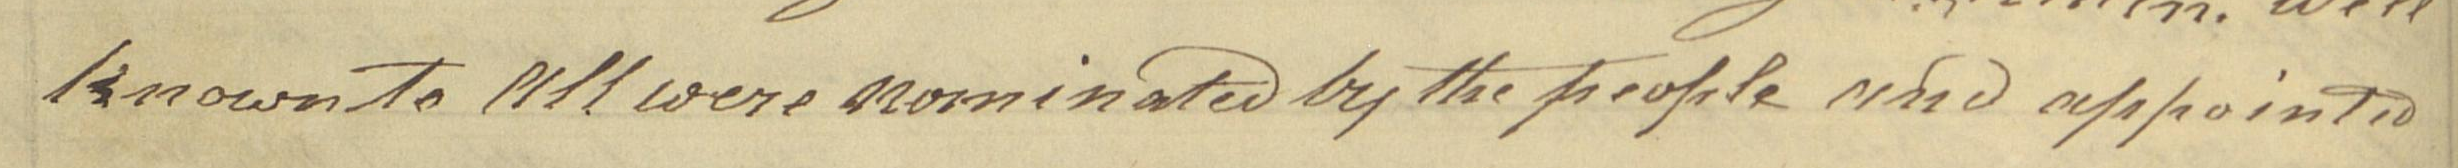known to All were nominated by the people and appointed
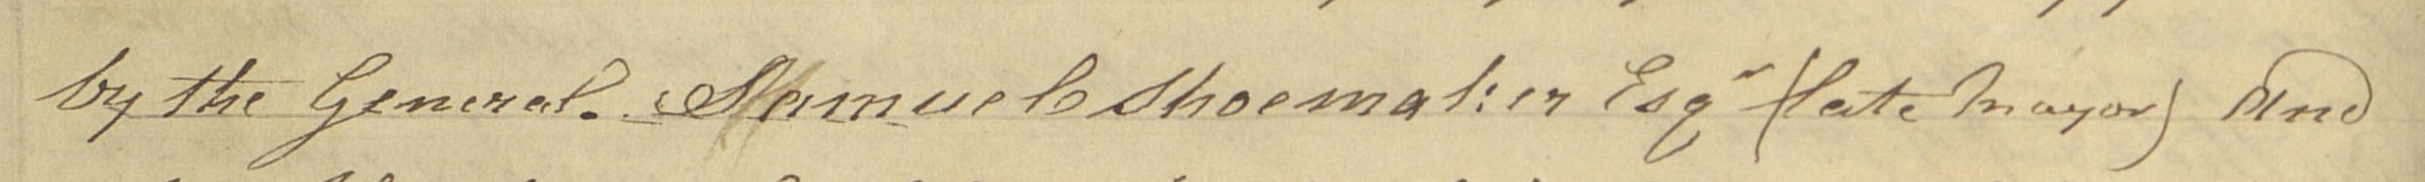by the General. Samuel Shoemaker Esq^r. (late mayor) and
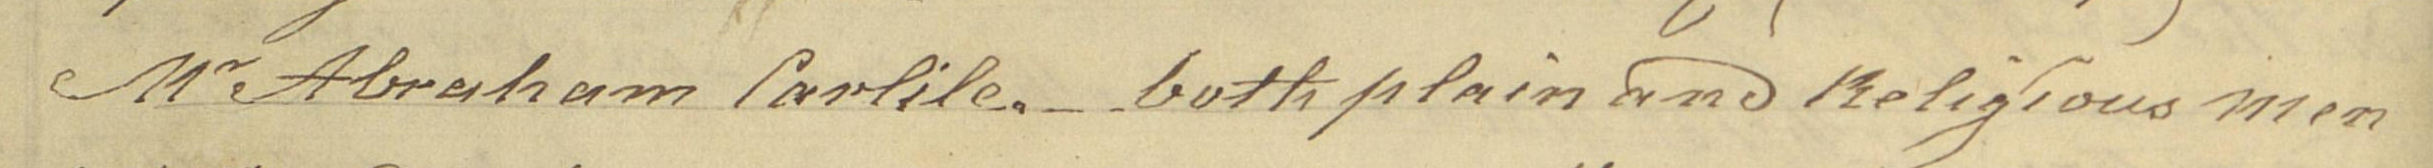M^r. Abraham Carlile. both plain and Religious Men
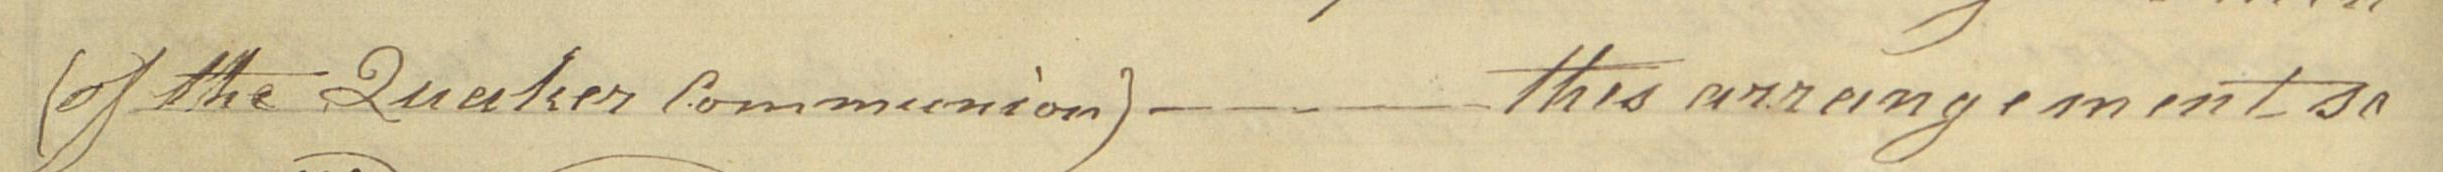(of the Quaker Communion) this arrangement so
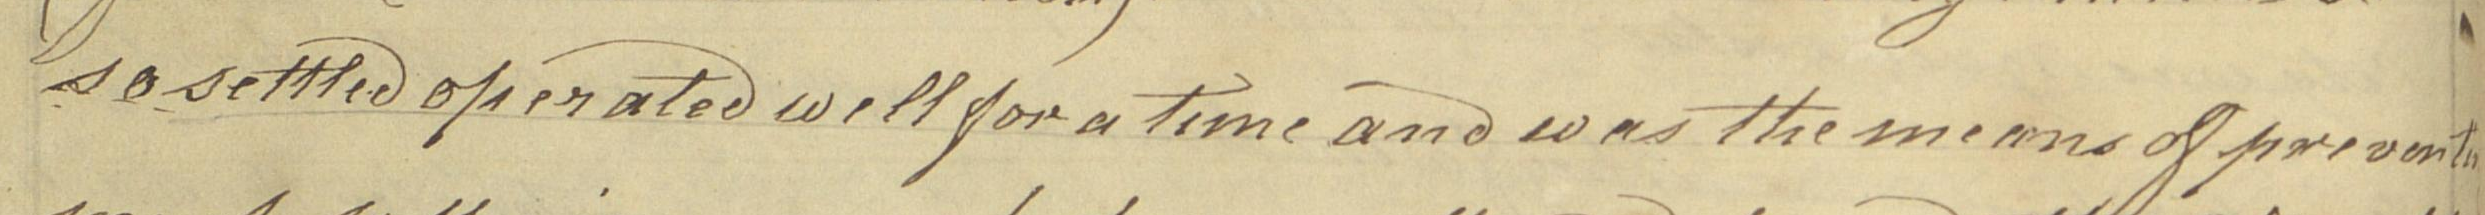so settled operated well for a time and was the means of prevent-
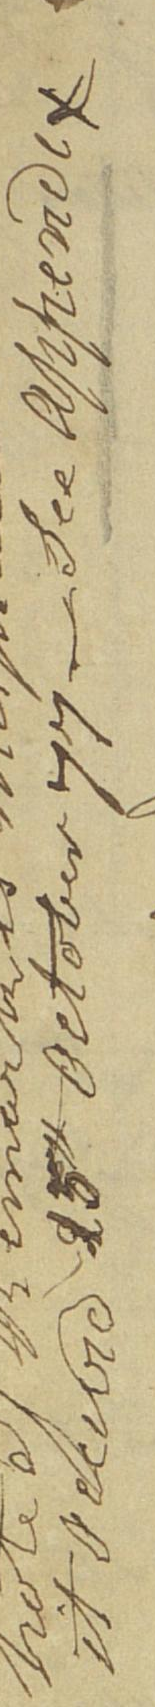it recevd 15^th October 77 See Appendix
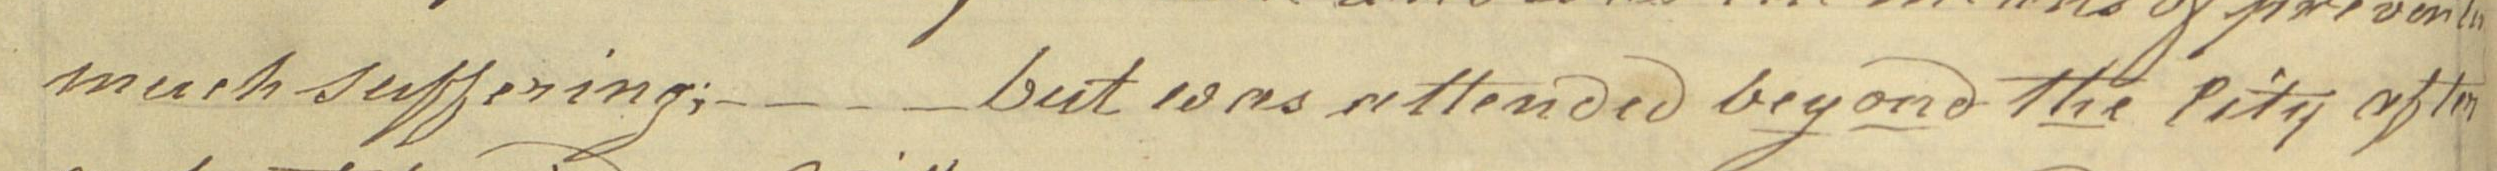much suffering; but was attended beyond the City of after
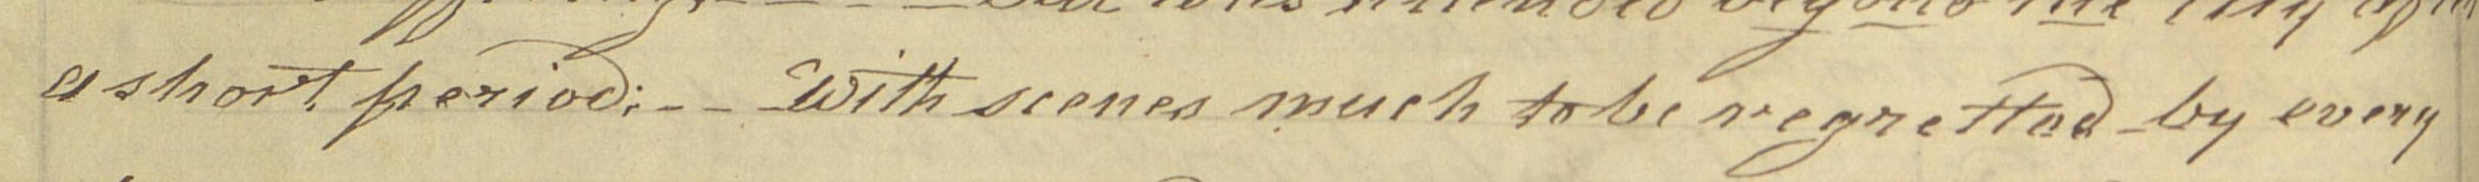a short period; With scenes much to be regretted by every
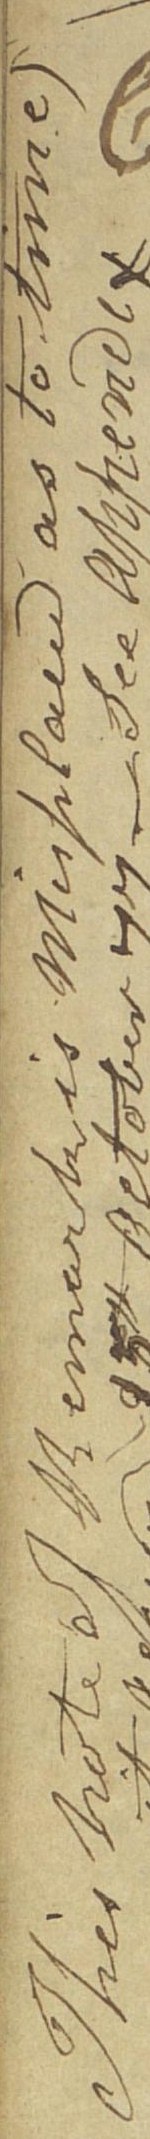This note of Remark is misplaced as to time)
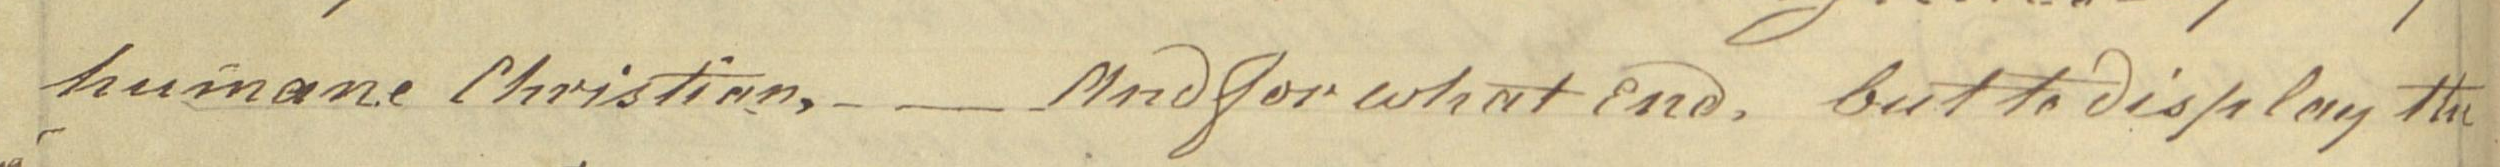humane Christian, And for what end, but to display the
